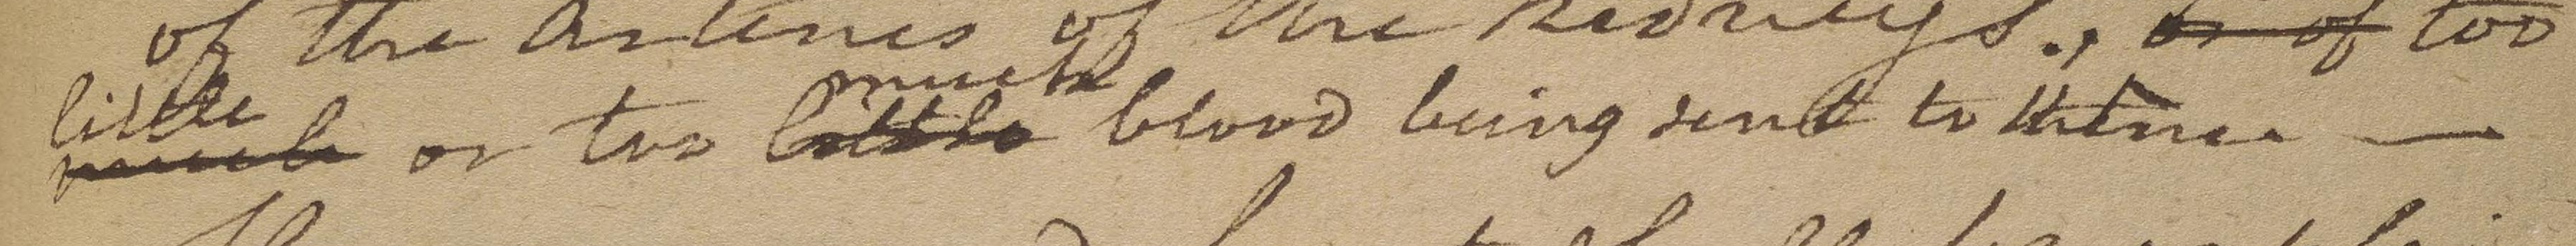[much] or too [little] blood being sent to there.-
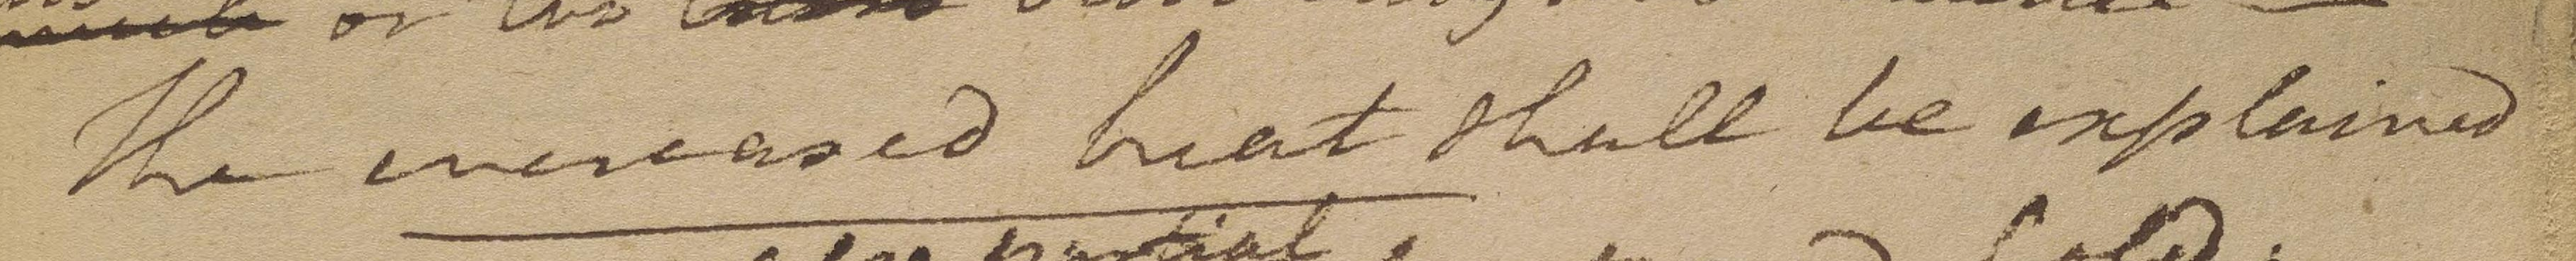The encreased heat shall be explained
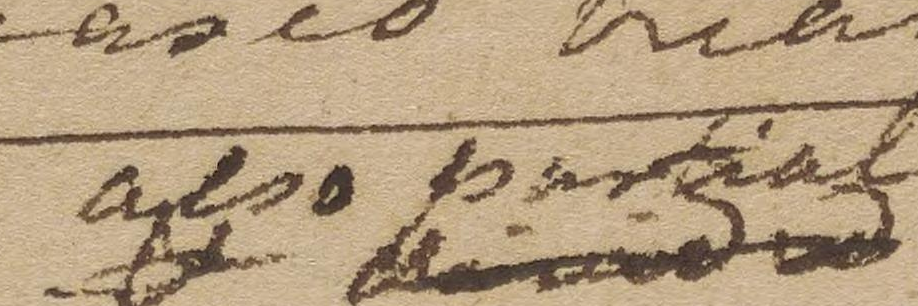also partial
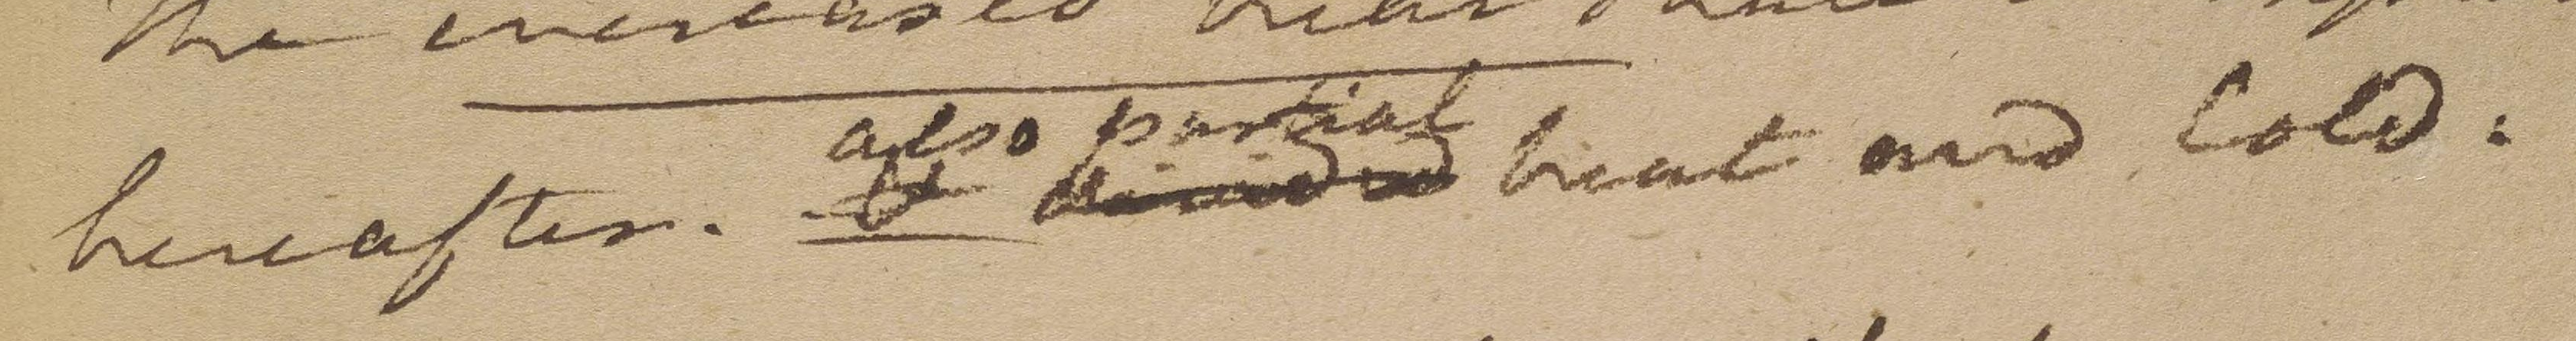hereafter. [& divided] heat and cold
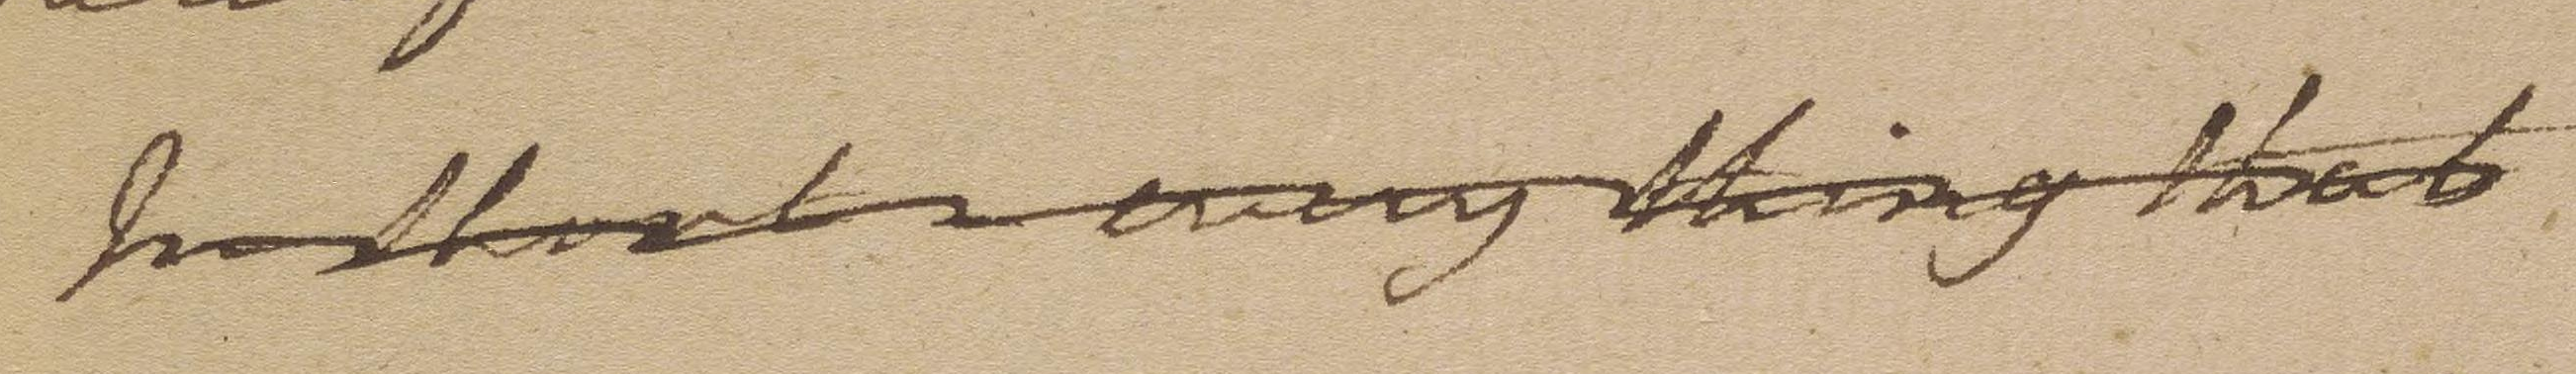In short every thing that
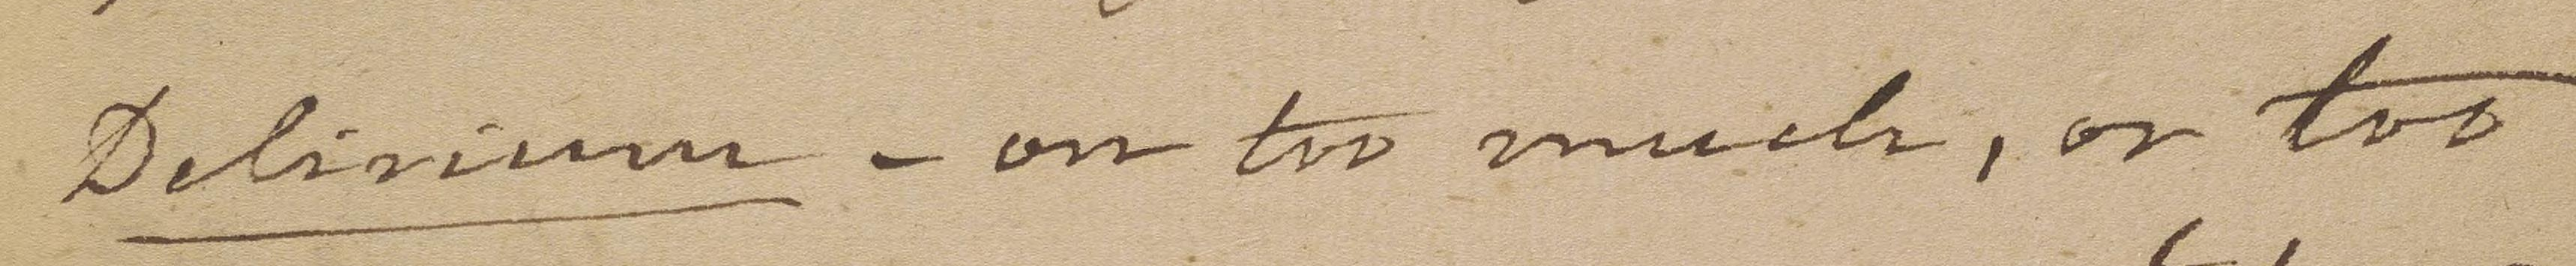Delirium, on too much, or too
